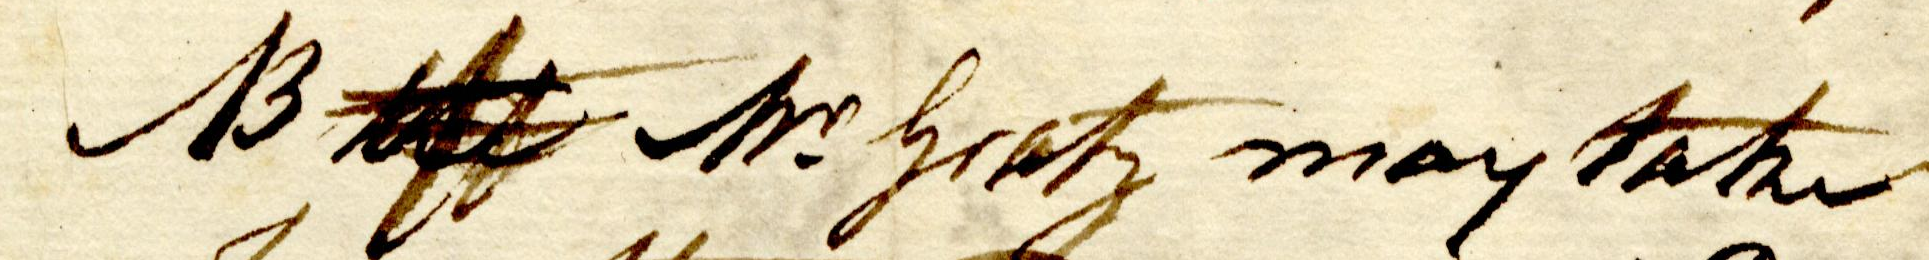NB [__] M^r Gratz may take
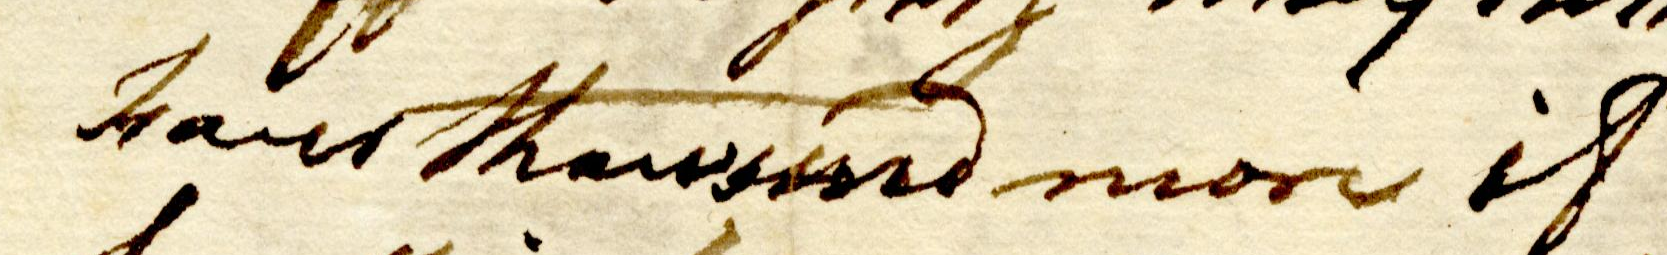Four thousand more if
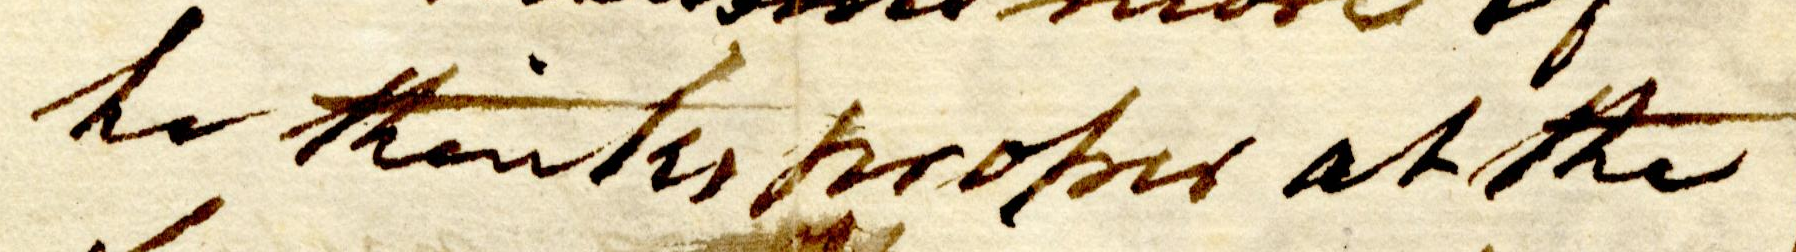he thinks proper at the
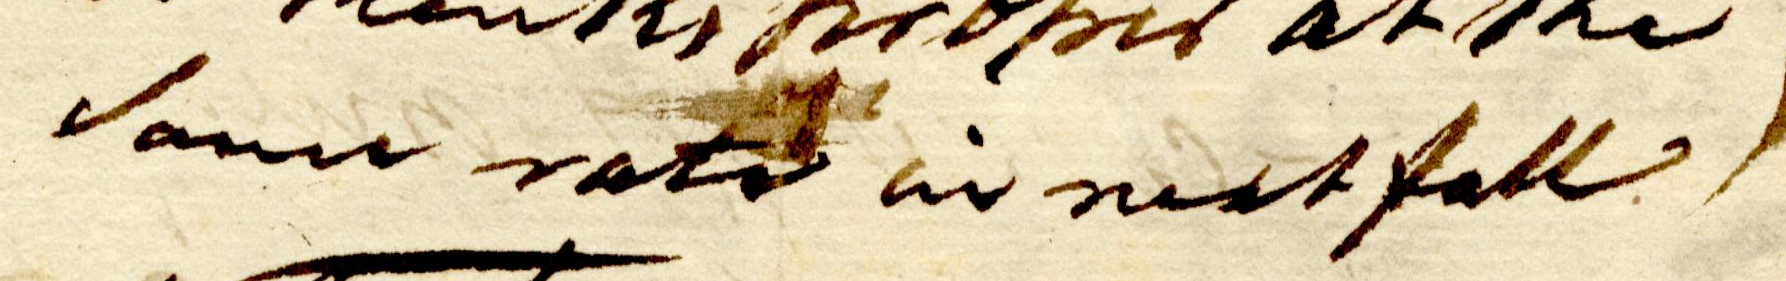same rate in next fall
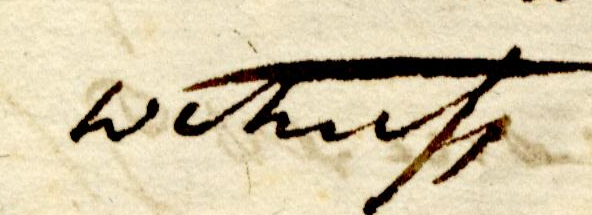witness
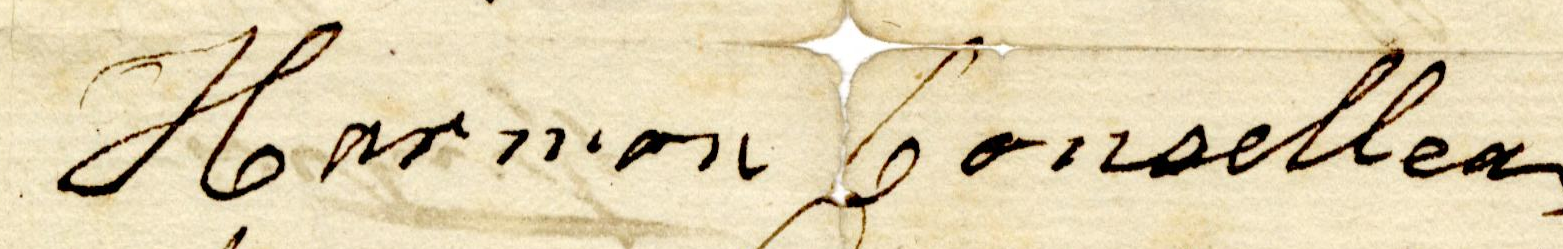Harmon Consellea
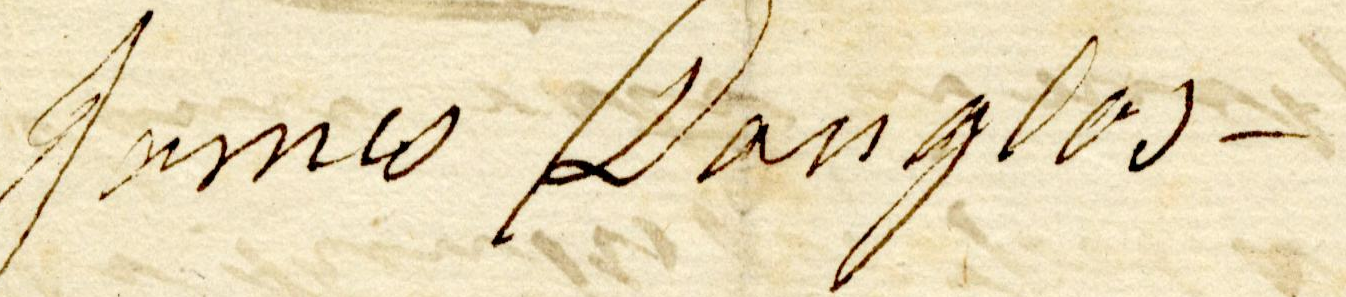James Douglas-
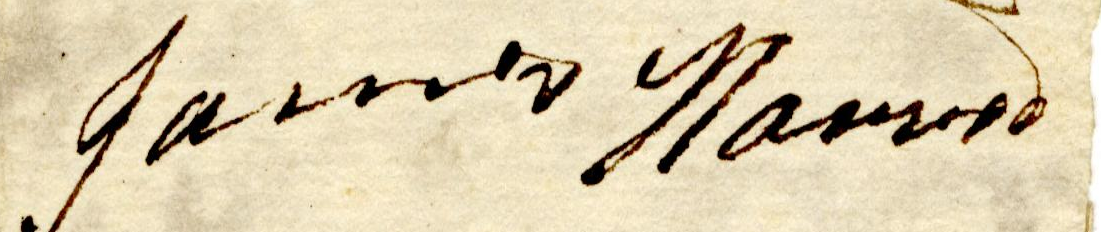James Marred
